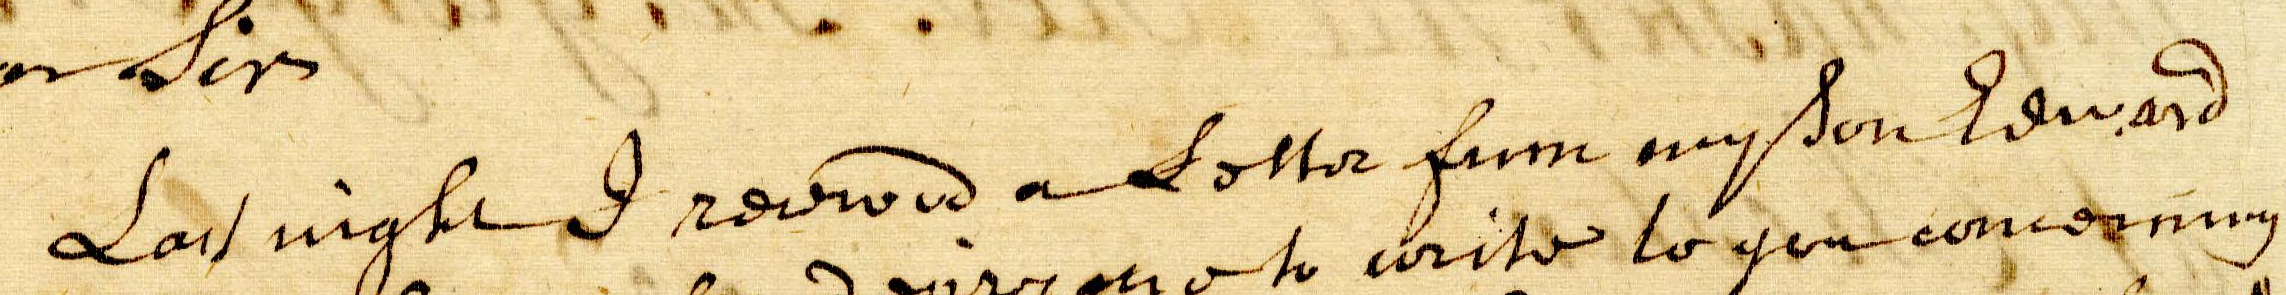Last night I received a Letter from my Son Edward
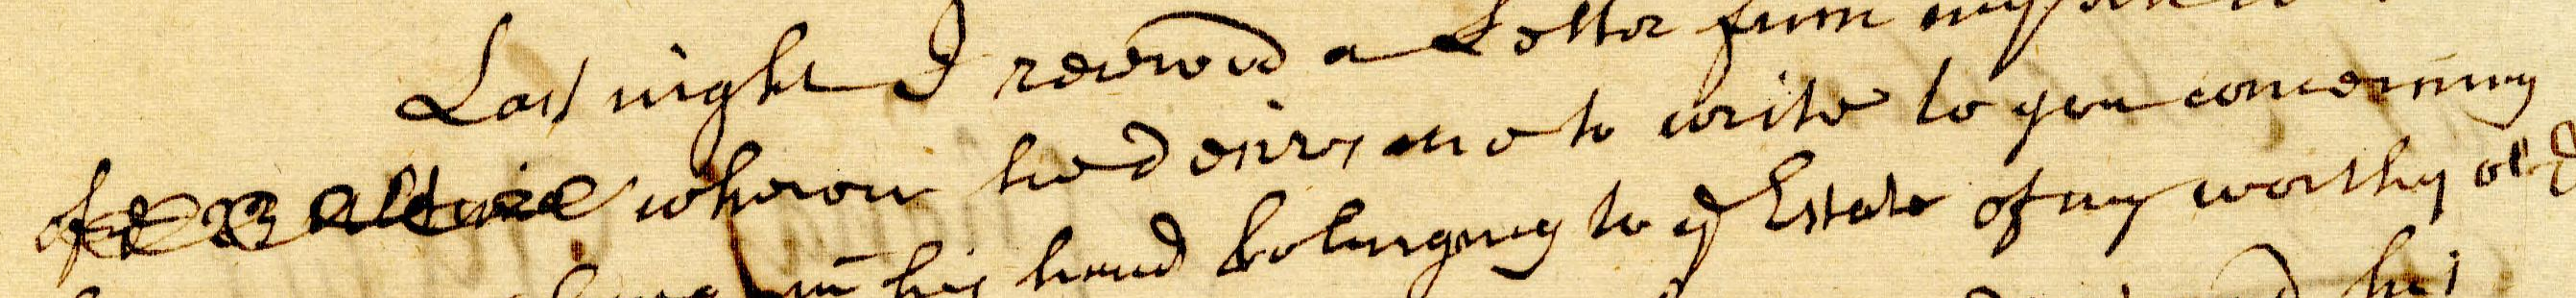[of a 23 ______] whom had desired to write to you concerning
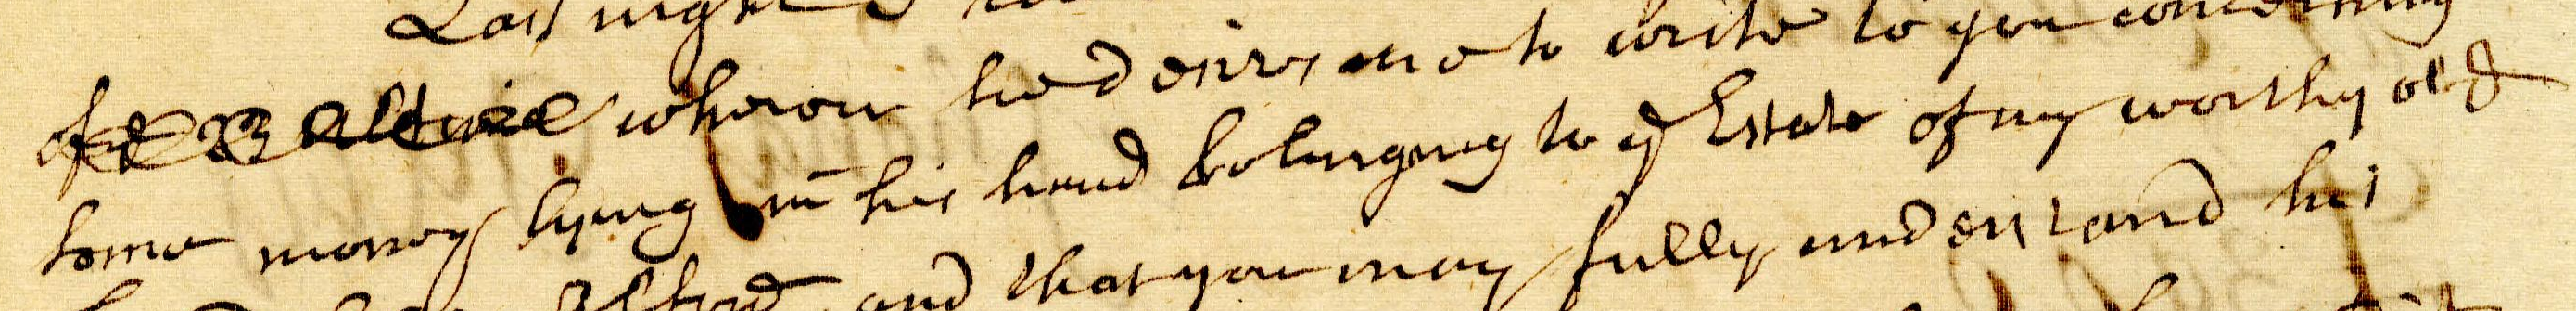some money lying in his hand belonging to y^e Estate of my worthy old
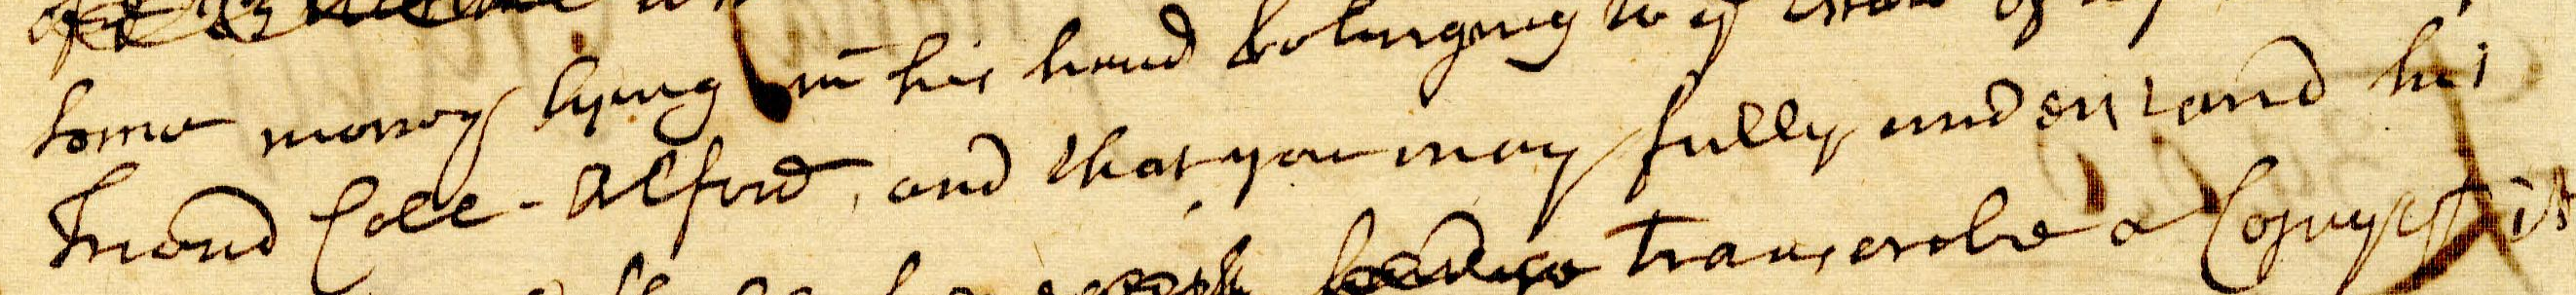Friend Coll- Alferd, and that you may fully understand his
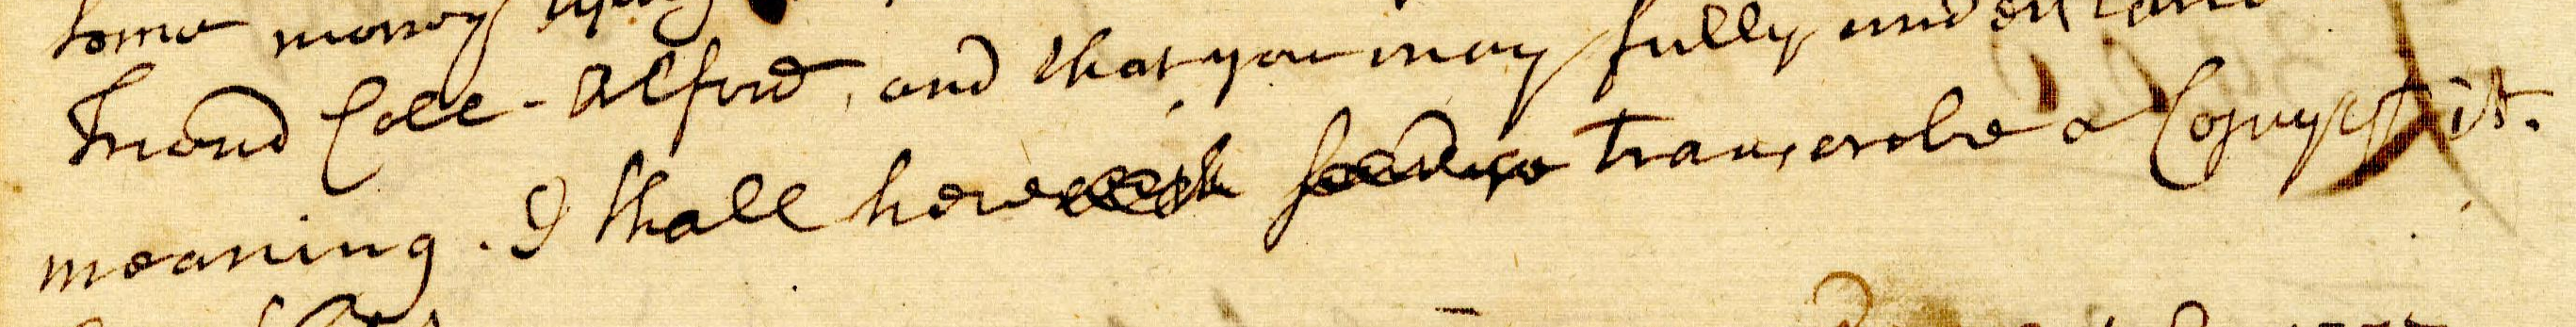meaning. I shall here[with send] transcribe a Copy of it.
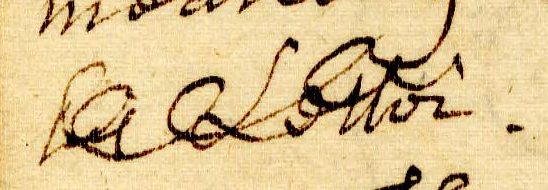[a Letter.]
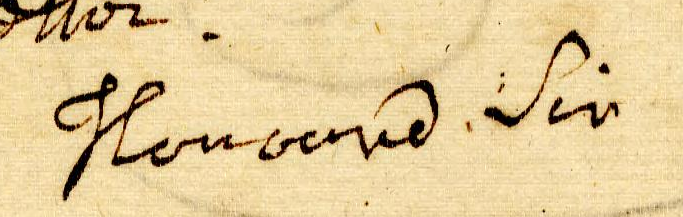Honourd Sir
